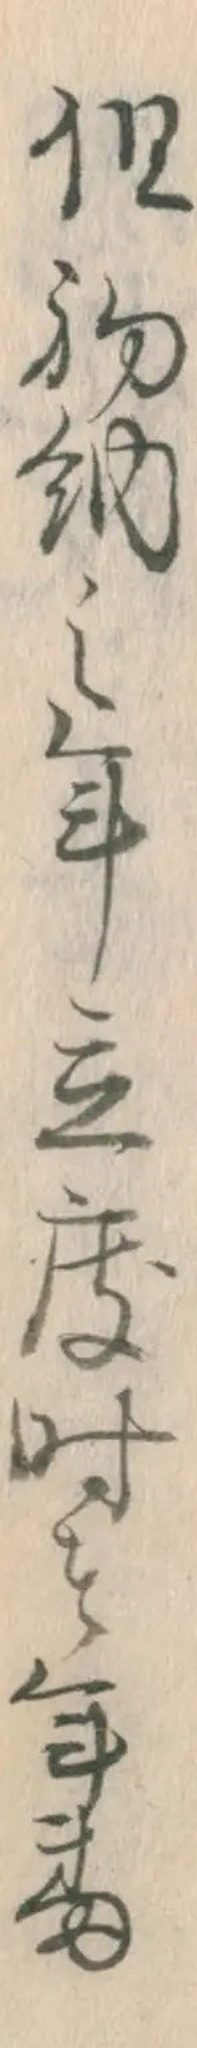但初納之年立度時は年番
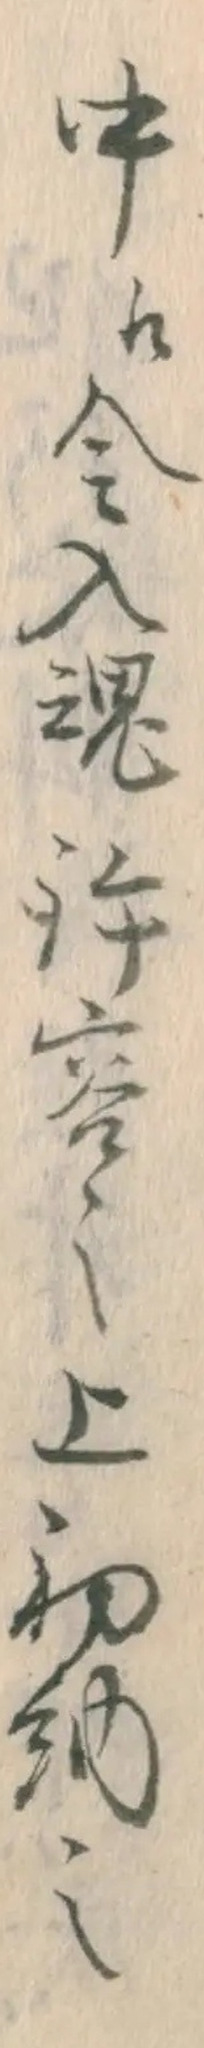中え令入魂許容之上初納之
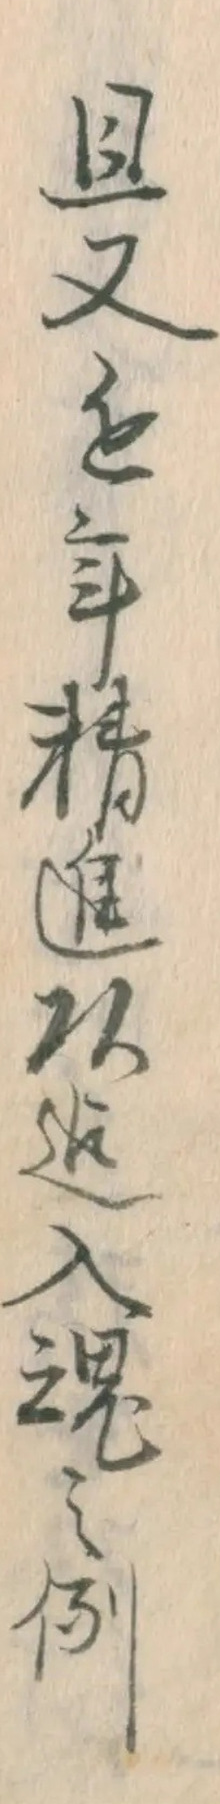且又近年精進頭迄入魂之例

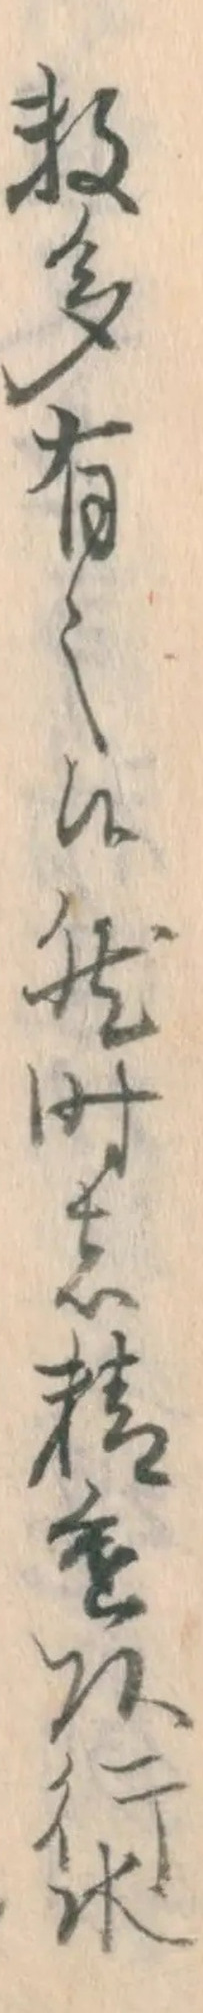数多有之候然時者精進頭行水
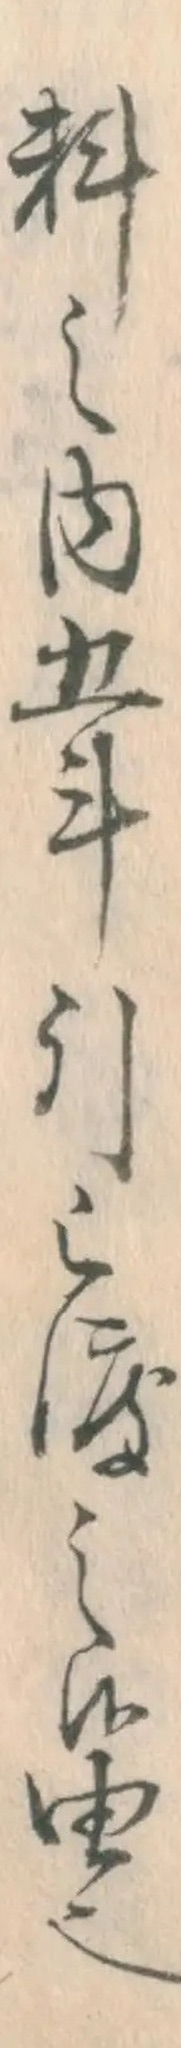料之内五斗引被渡之候由也
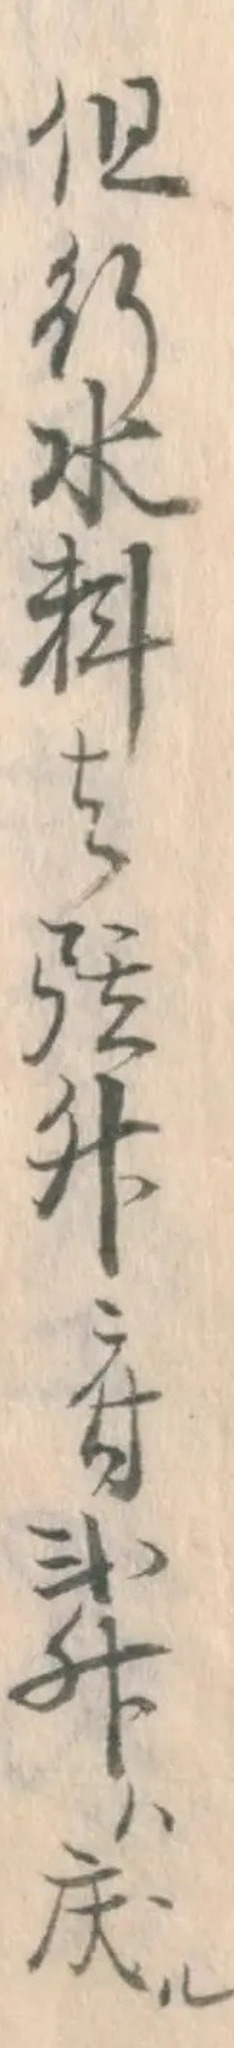但行水料は弦升ニ付弐升ハ戻ル
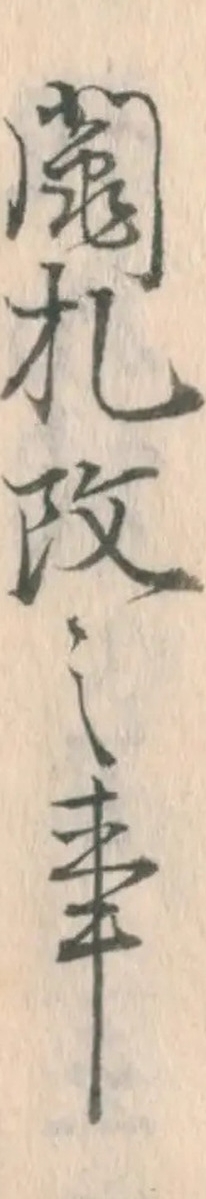鬮札改之事
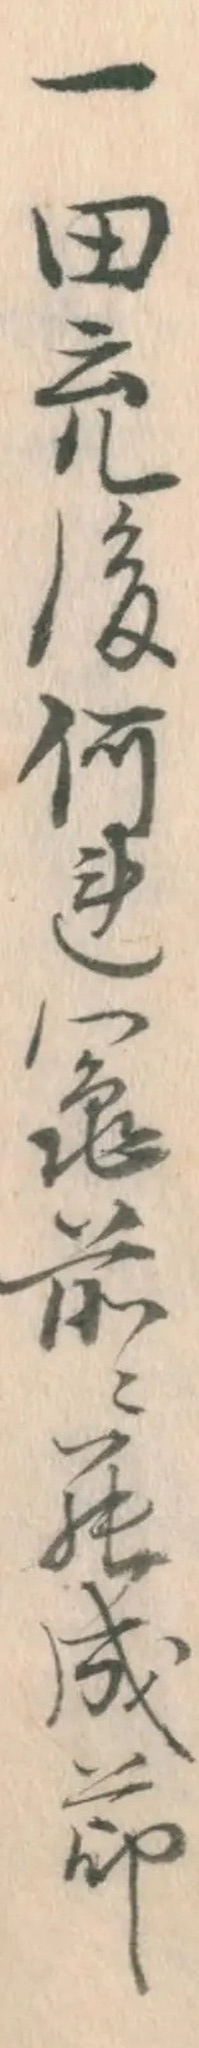一田充後何れ鬮前に罷成節
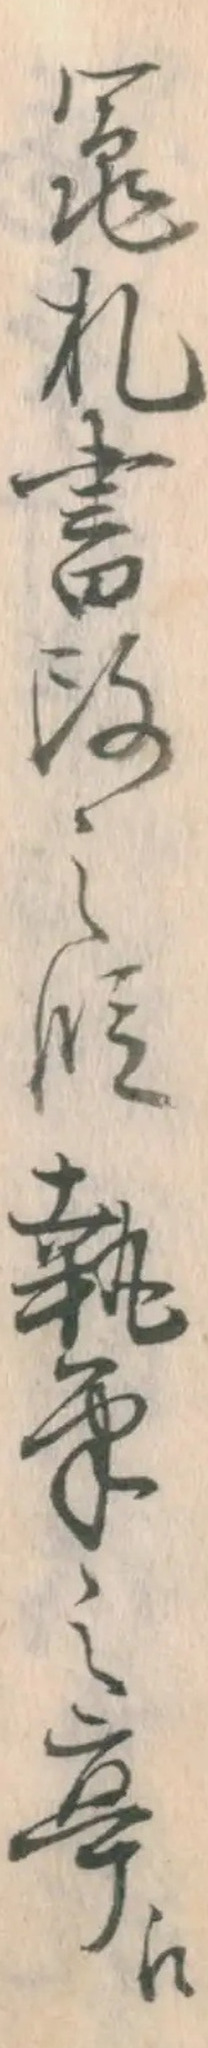鬮札書改之段執筆之亭え
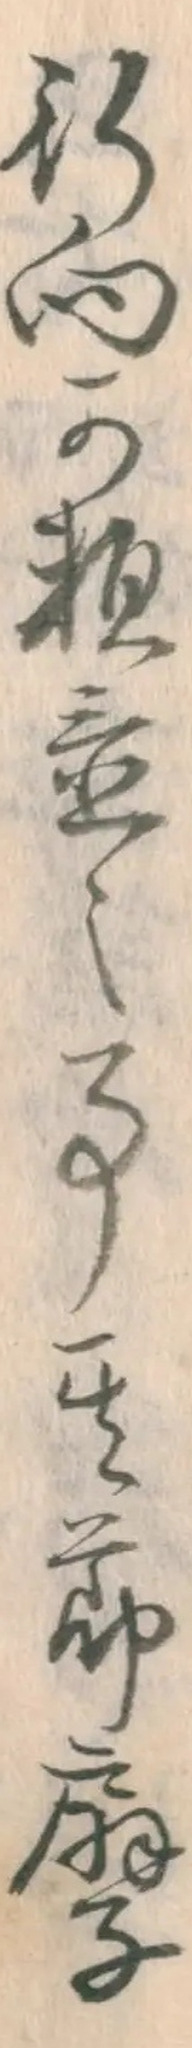行向可頼置之事其節扇子
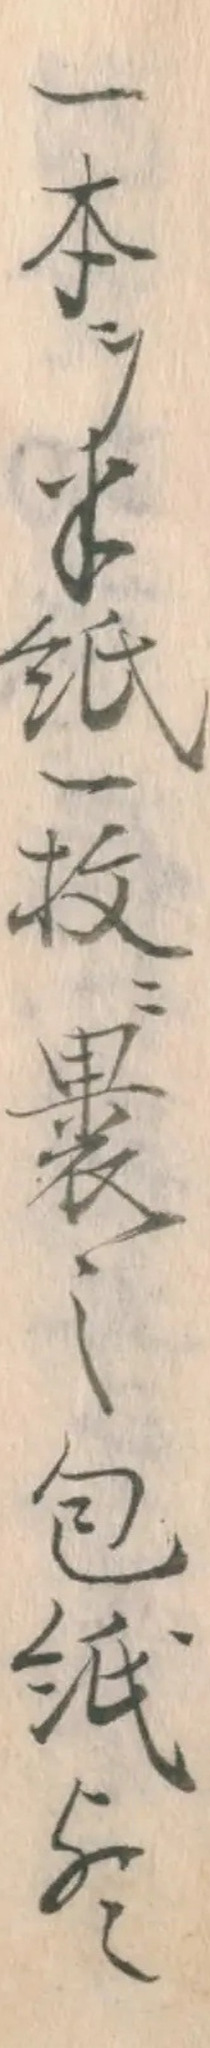一本を半紙一枚ニ褁之包紙歟
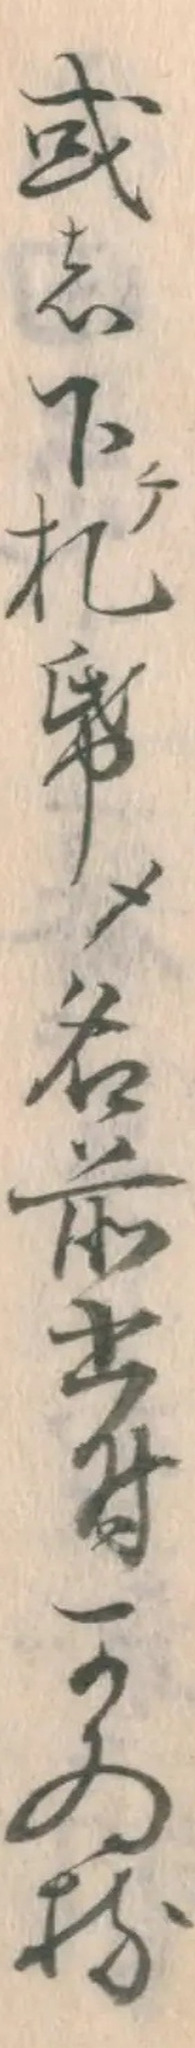或者下ケ札帋〆名前書付可為持
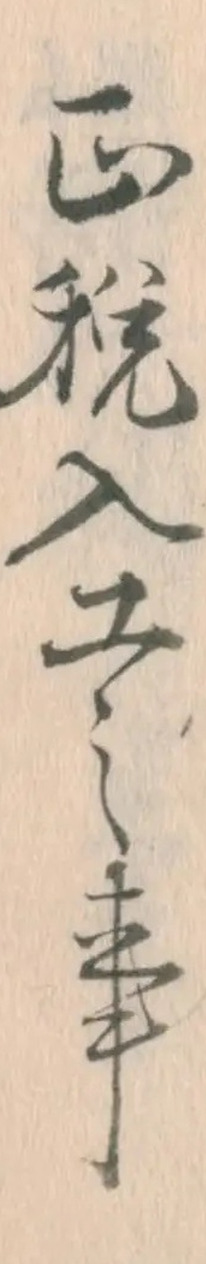正税入工之事
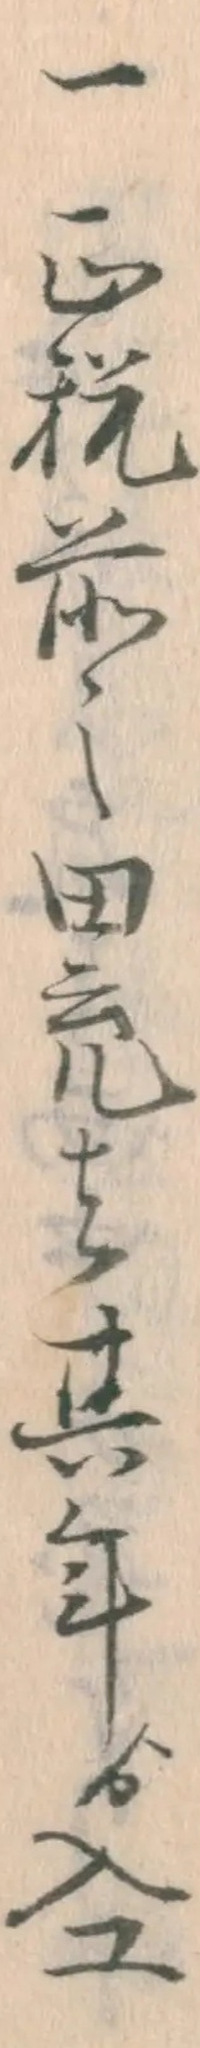一正税前之田充は其年ゟ入工
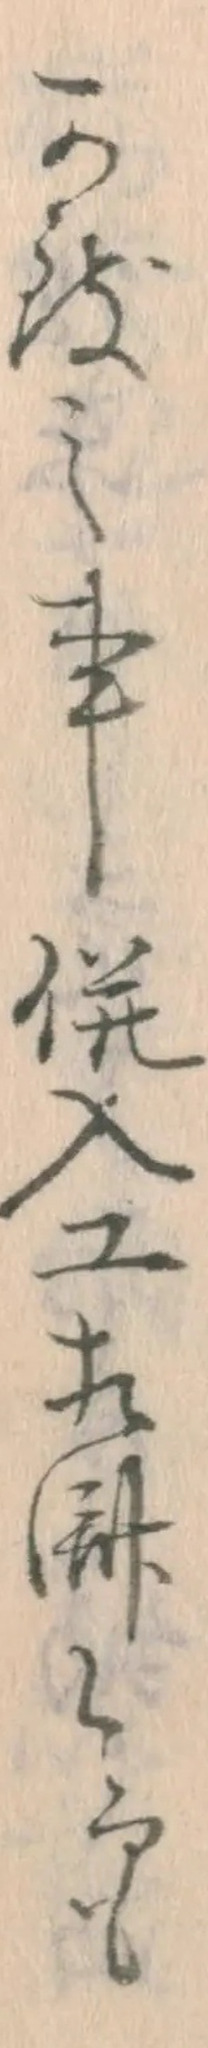可致之事併入工相済候而も
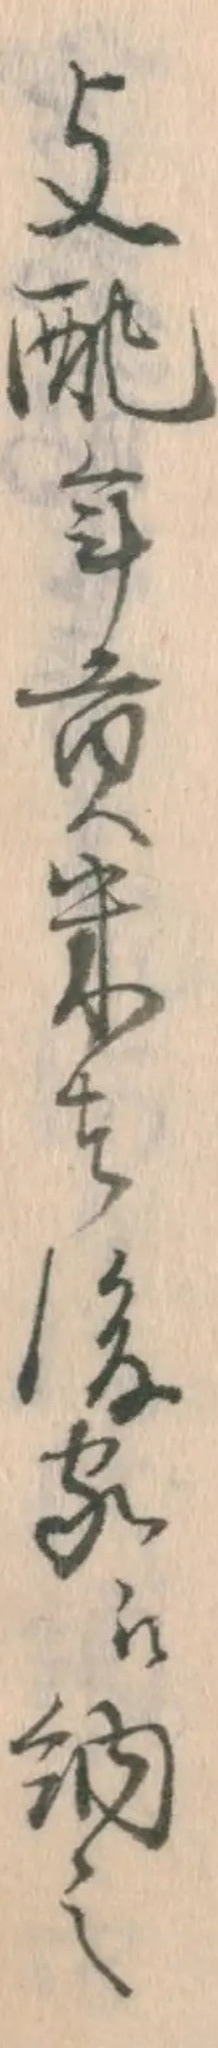支配年貢米は後家え納之
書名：賀茂社記録. 第81冊
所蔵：国立国会図書館 National Diet Library, JAPAN
